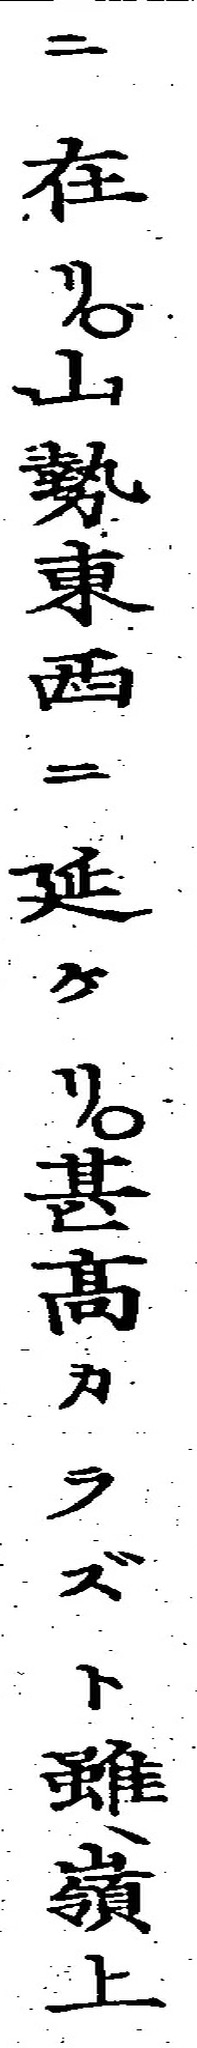ニ在リ。山勢東西ニ延ケリ。甚高カラズト雖、嶺上
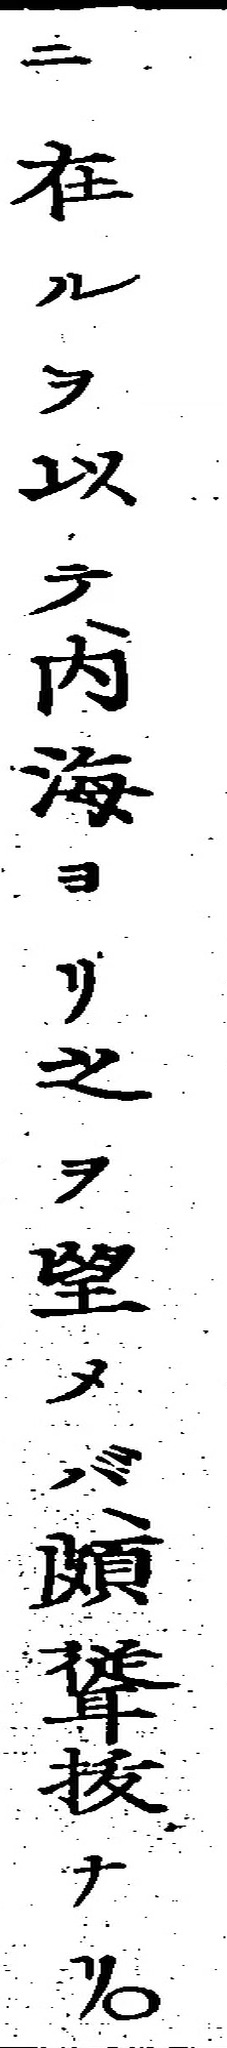ニ在ルヲ以テ、内海ヨリ之ヲ望メバ、頗聳抜ナリ。
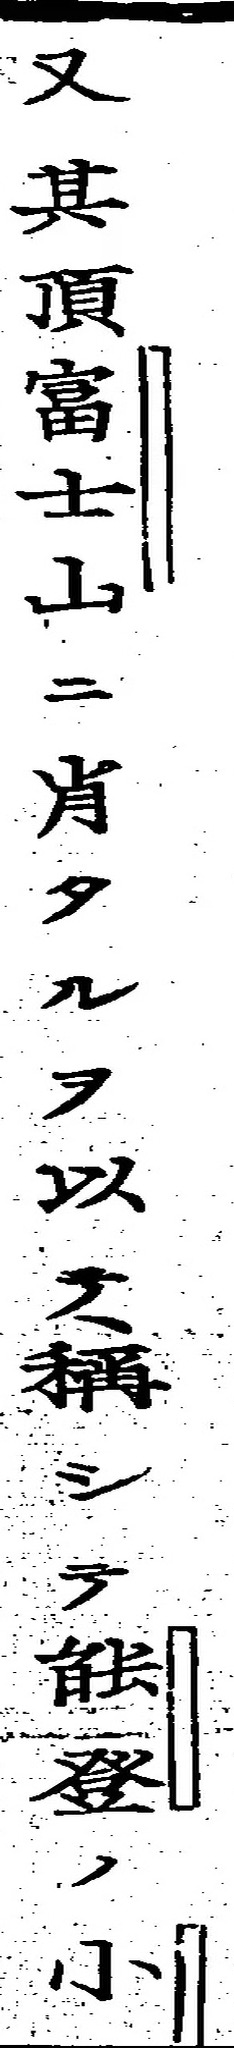又其頂富士山ニ肖タルヲ以テ、称シテ能登ノ小
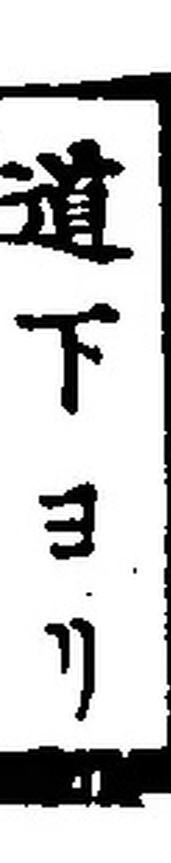道下ヨリ
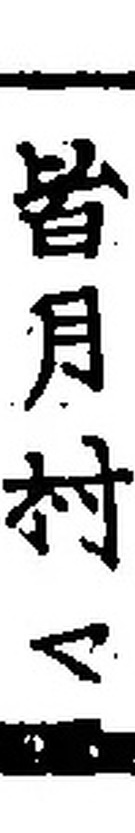皆月村マ
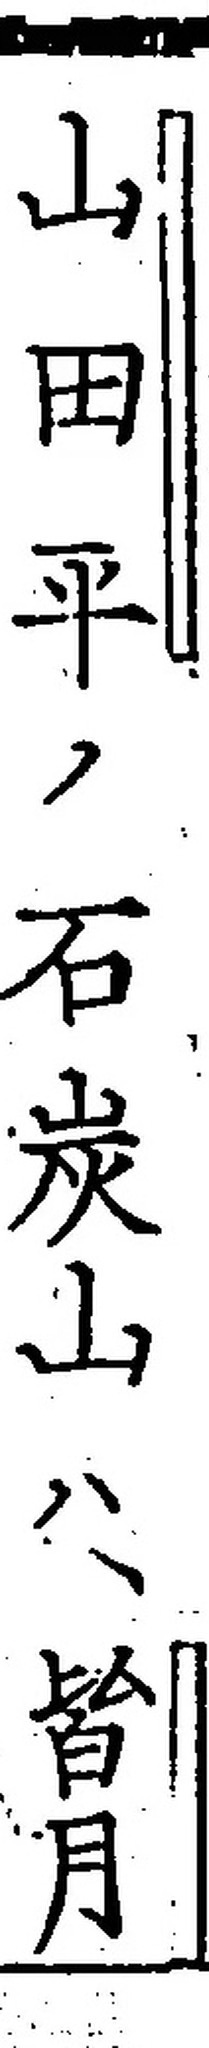山田平ノ石炭山ハ、皆月
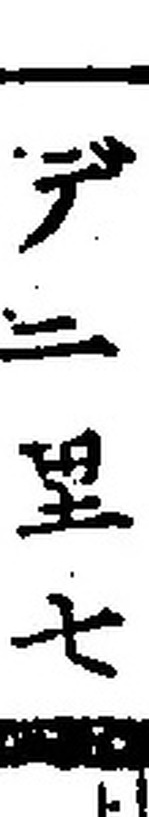デ二里七
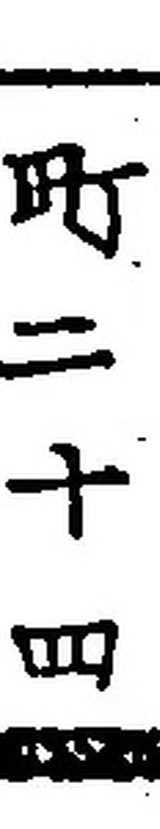町二十四
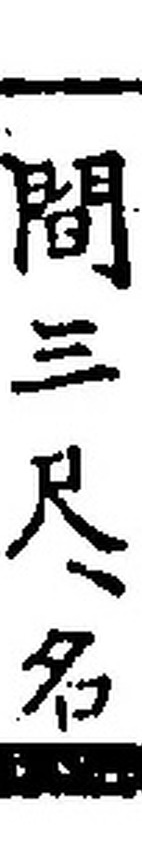間三尺、名
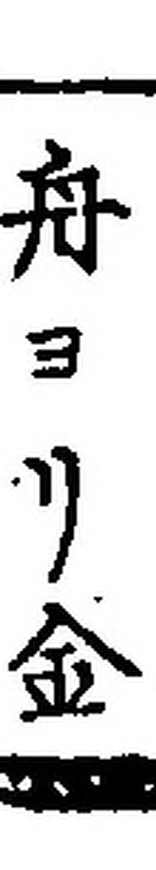舟ヨリ金
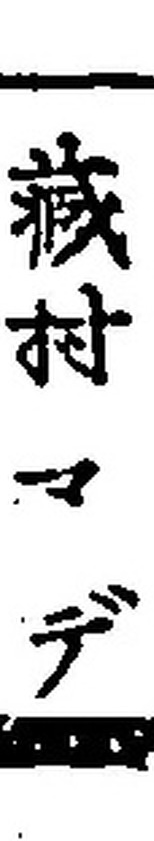蔵村マデ
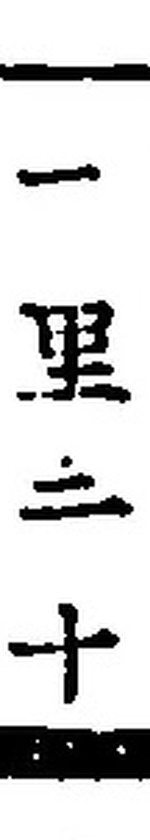一里二十
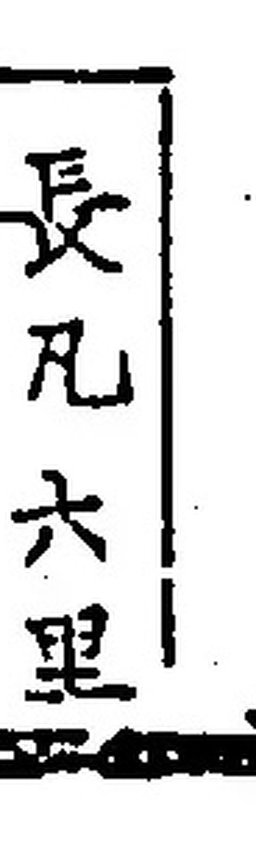長凡六里
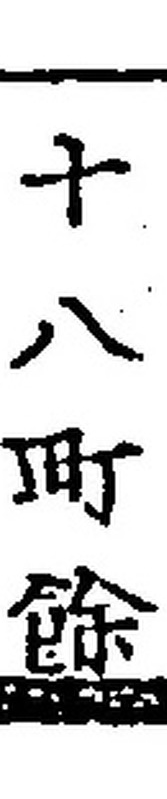十八町余
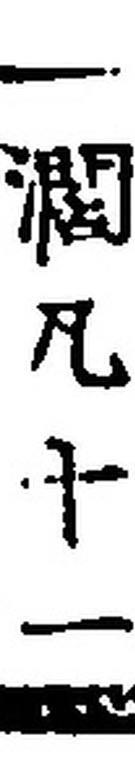闊凡十一
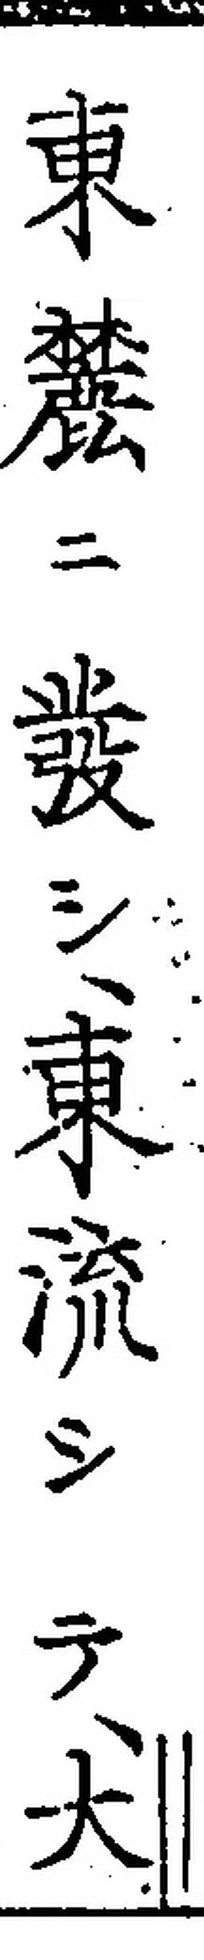東麓ニ発シ、東流シテ、大
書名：能登地誌略
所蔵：国立国会図書館 National Diet Library, JAPAN
